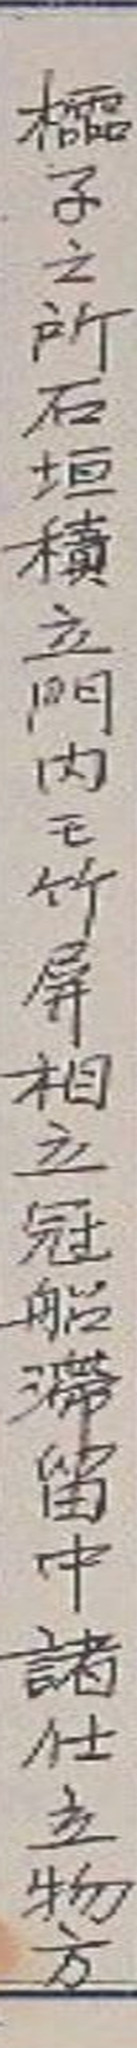櫺子之所石垣積立門内も竹屏相立冠船滞留中諸仕立物方
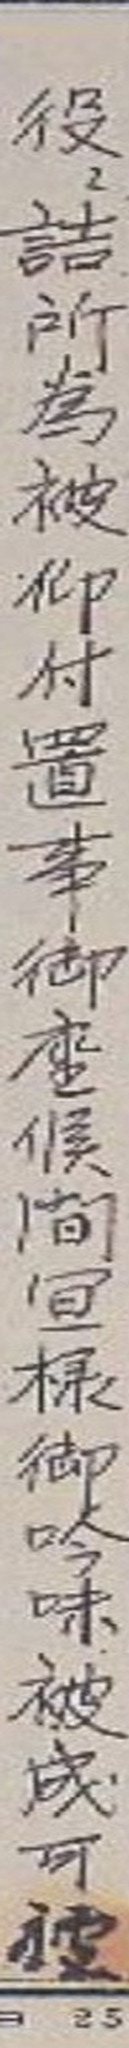役々詰所為被仰付置事御座候間宜様御吟味被成可被
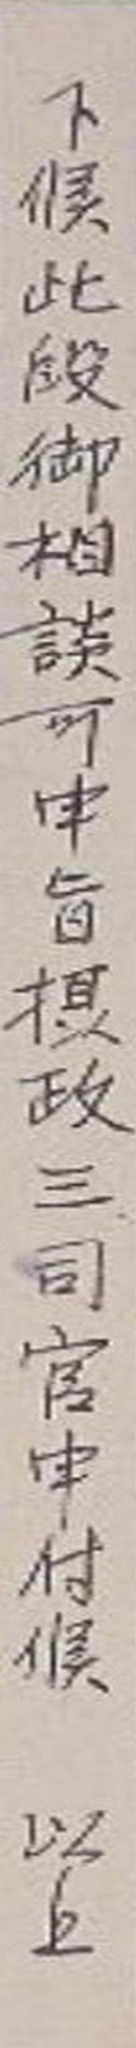下候此段御相談可申旨摂政三司官申付候以上
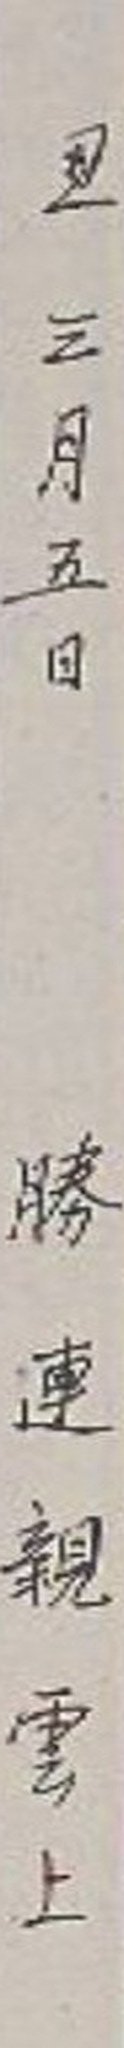丑三月五日勝連親雲上
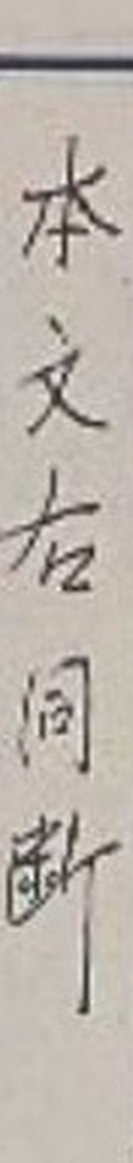本文右同断
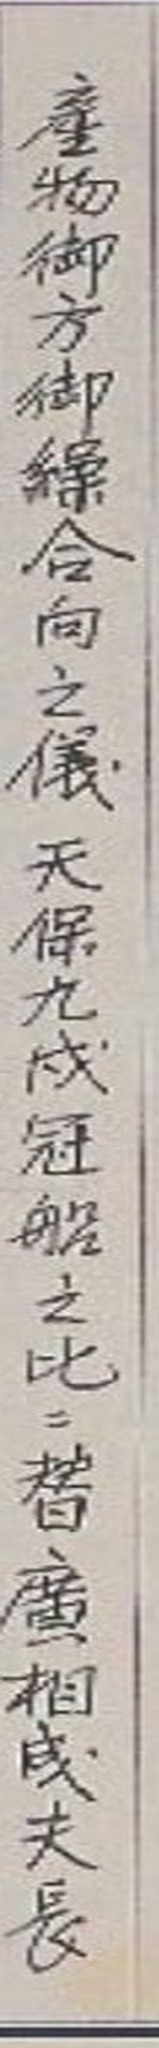産物御方御繰合向之儀天保九戌冠船之比に替広相成夫長
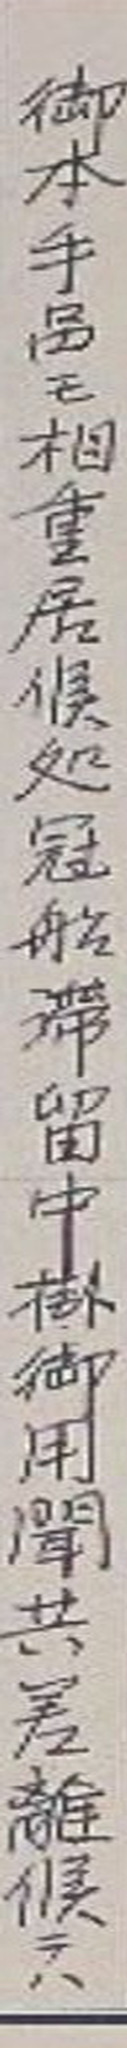御本手品も相重居候処冠船滞留中掛御用聞共差離候ては
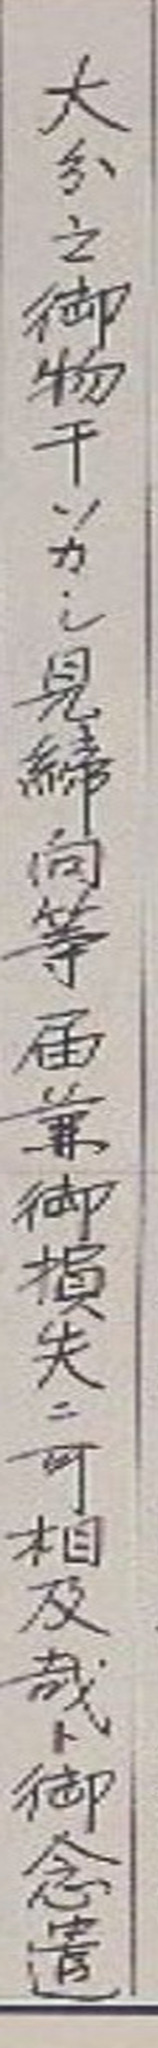大分之御物干そかし見締向等届兼御損失に可相及哉と御念遣
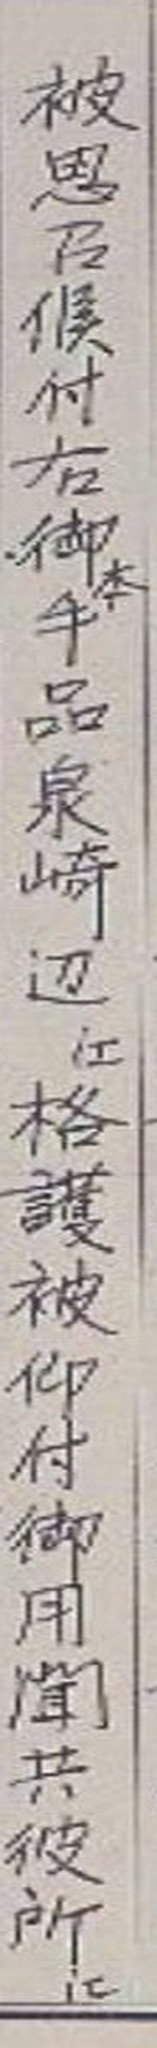被思召候付右御本手品泉崎辺え格護被仰付御用聞共彼所え
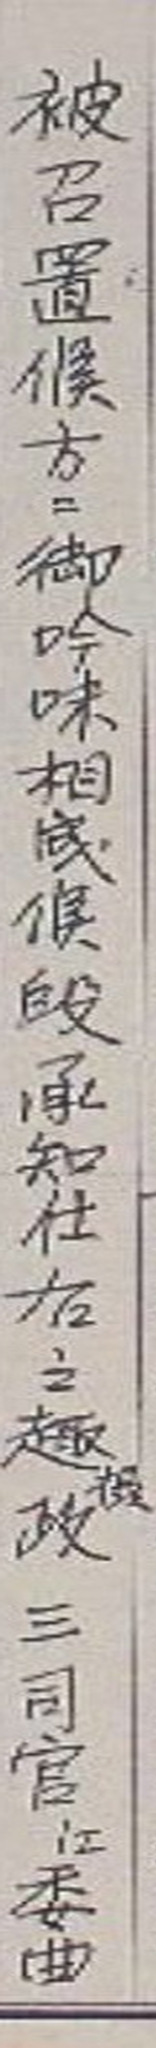被召置候方に御吟味相成候段承知仕右之趣摂政三司官え委曲
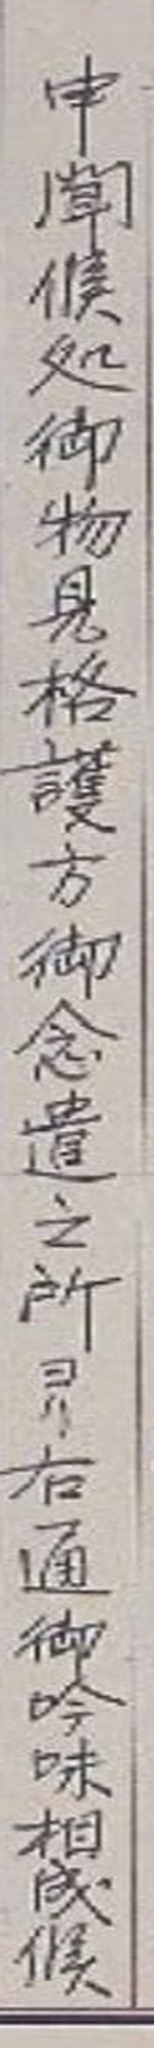申聞候処御物見各護方御念遣之所より右通御吟味相成候
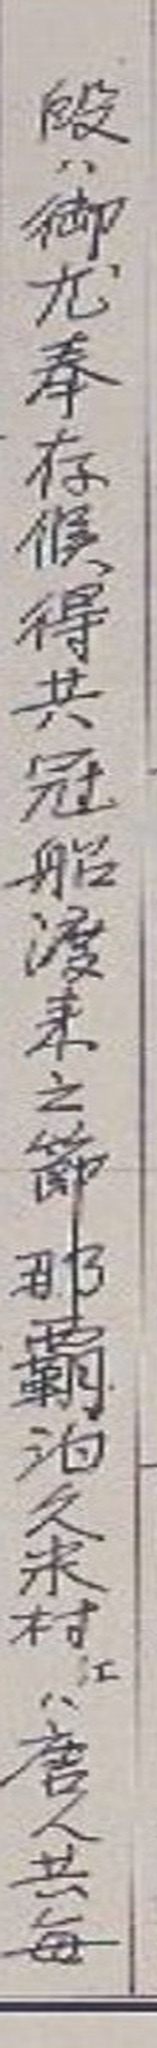段は御尤奉存候得共冠船渡来之節那覇泊久米村えは唐人共毎
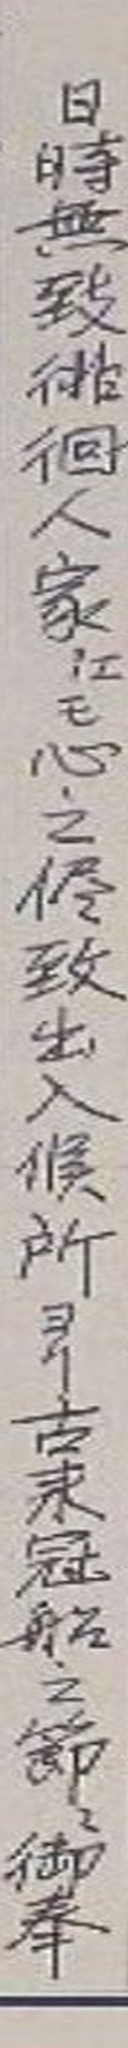日時無致徘徊人家えも心之儘致出入候所より古来冠船之節々御奉
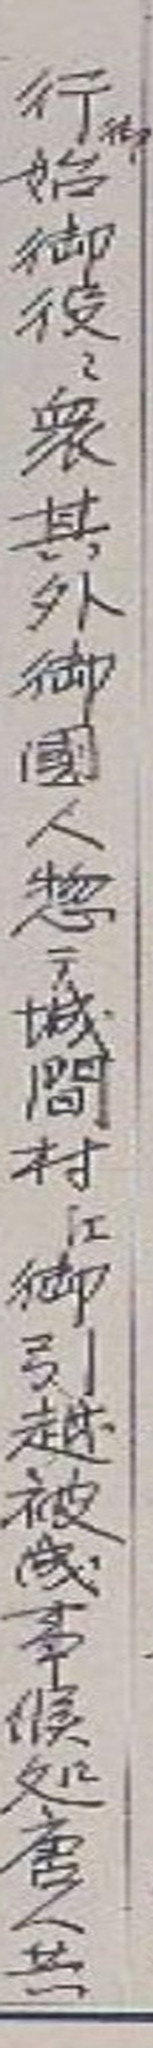行御始御役々衆其外御国人惣て城間村え御引越被成事候処唐人共
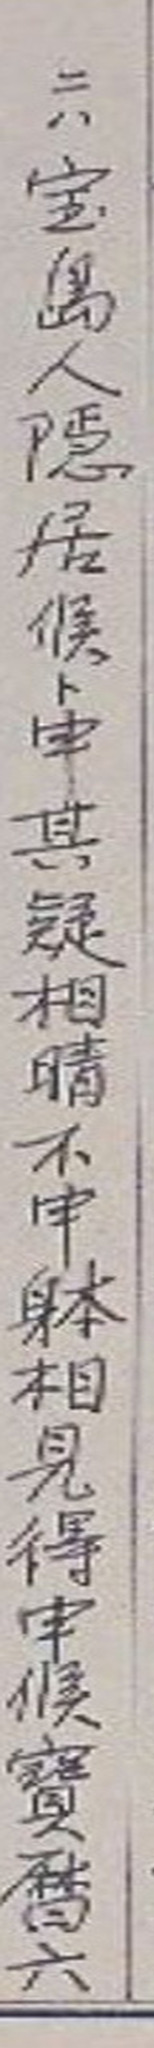には宝島人隠居候と申其疑相晴不申躰相見得申候宝暦六
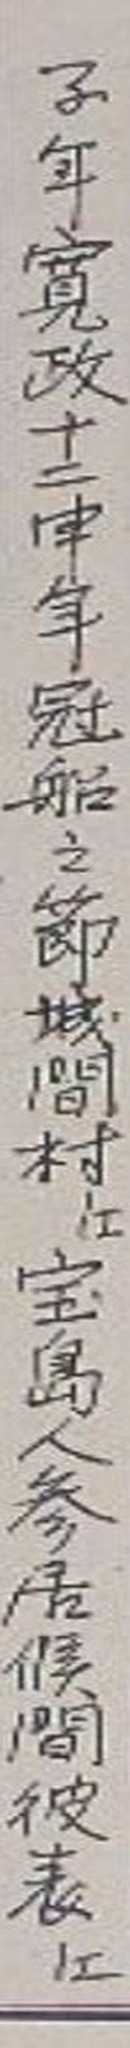子年寛政十二申年冠船之節城間村え宝島人参居候間彼表え
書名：支那冊封使来琉諸記 下巻
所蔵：University of the Ryukyus Library
